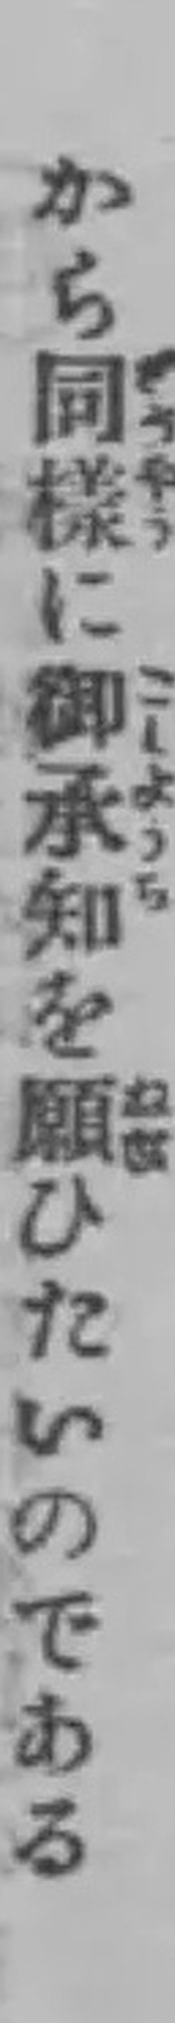から同様に御承知を願ひたいのである
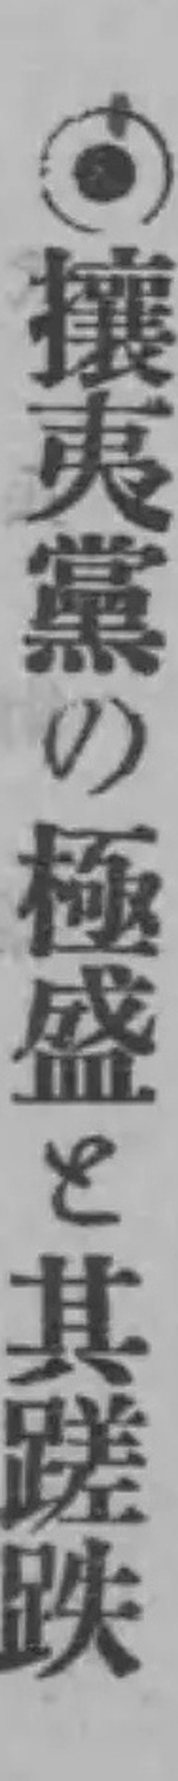⦿攘夷党の極盛と其蹉跌
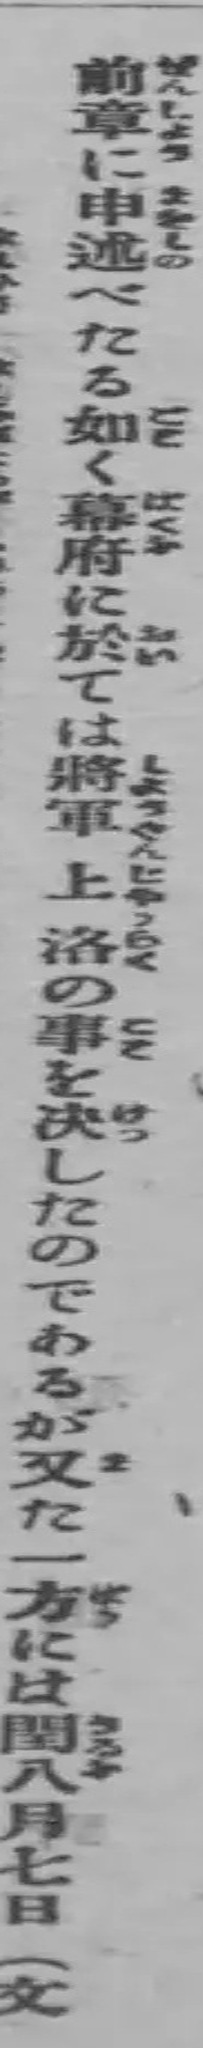勅使再東下前章に申述べたる如く幕府に於ては将軍上洛の事を決したのであるが又た一方には閏八月七日(文
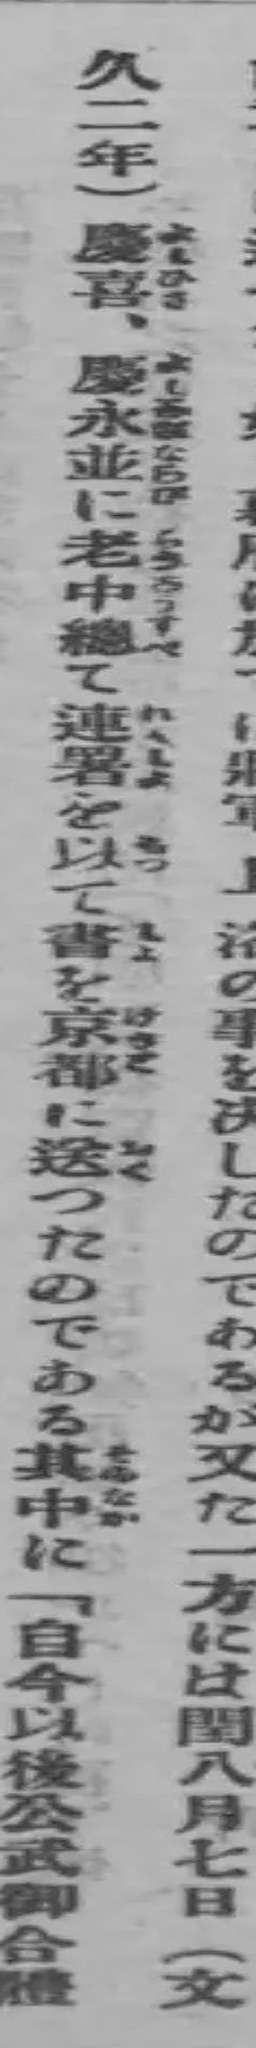久二年)慶喜、慶永並に老中総て連署を以て書を京都に送つたのである其中に「自今以後公武御合体
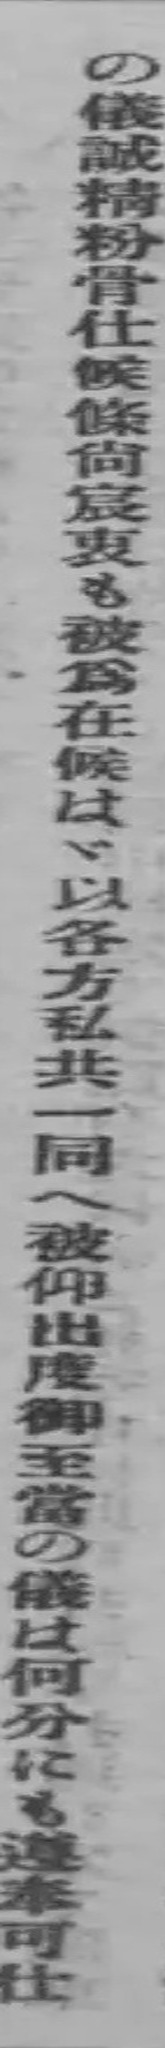の儀誠精粉骨仕候條尚宸衷も被為在候はゞ以各方私共一同へ被仰出度御至当の儀は何分にも遵奉可仕
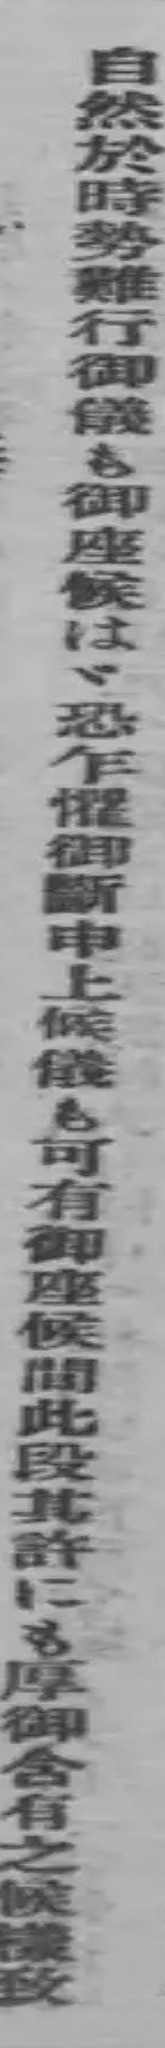自然於時勢難行御儀も御座候はゞ恐乍懼御断申上候儀も可有御座候間此段其許にも厚御含有之候様致
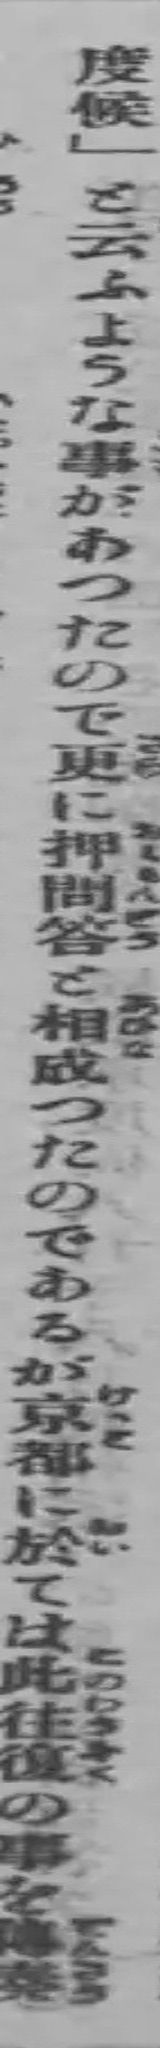度候」と云ふような事があつたので更に押問答と相成つたのであるが京都に於ては此往復の事を伝奏
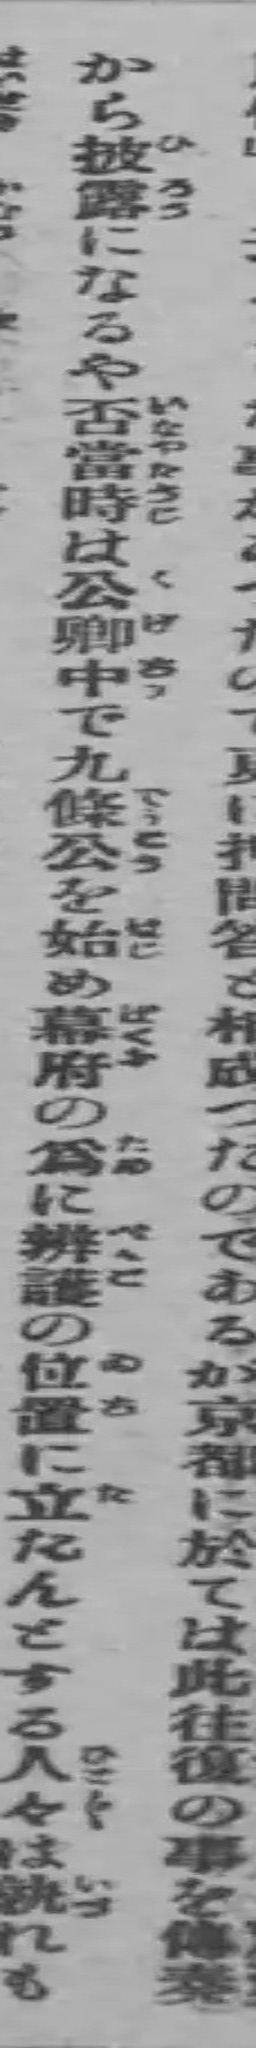から披露になるや否当時は公卿中で九條公を始め幕府の為に弁護の位置に立たんとする人々は孰れも
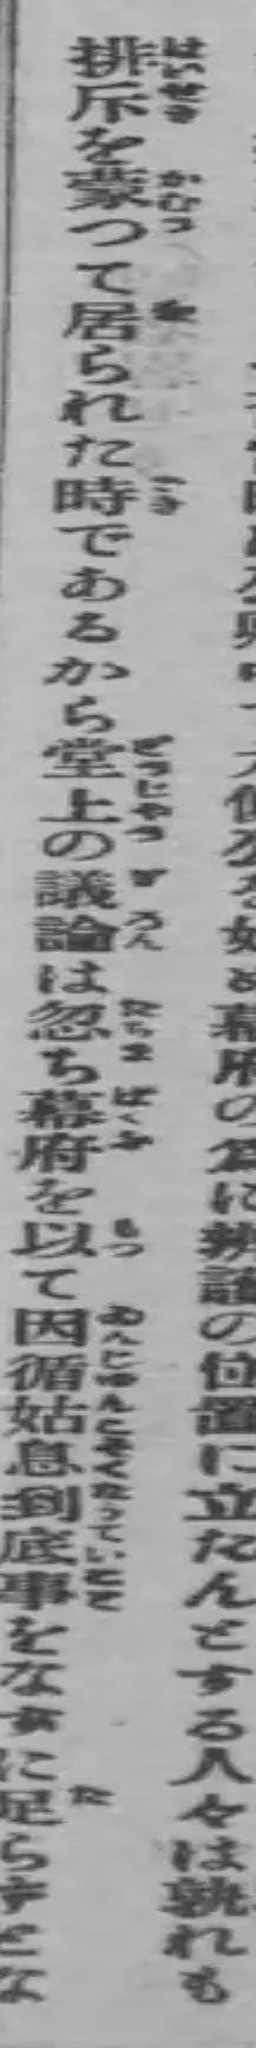排斥を蒙つて居られた時であるから堂上の議論は忽ち幕府を以て因循姑息到底事をなすに足らずとな
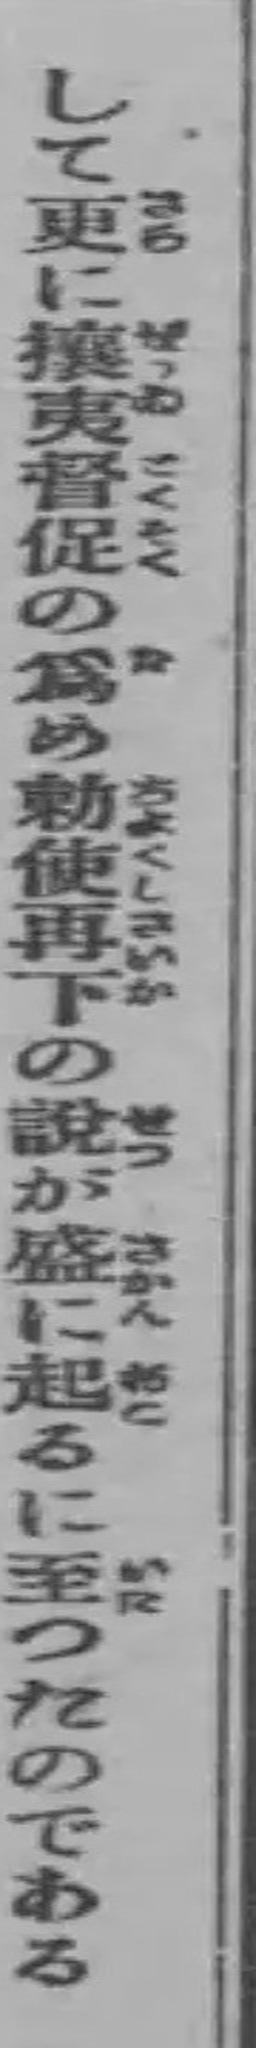して更に攘夷督促の為め勅使再下の説が盛に起るに至つたのである
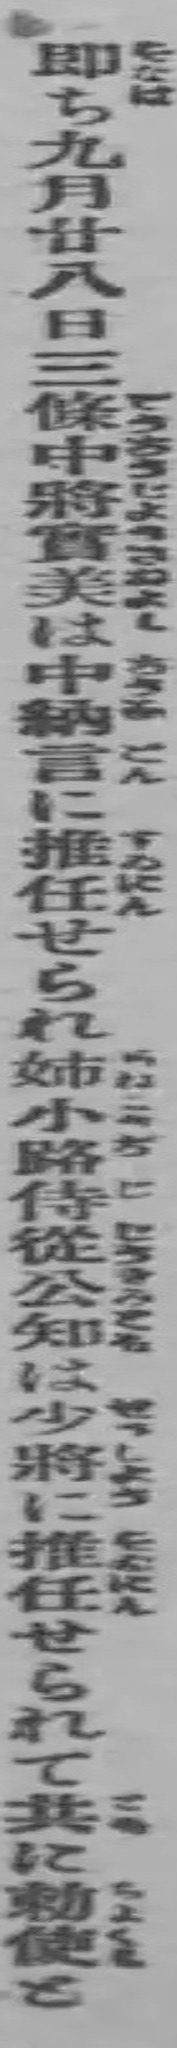即ち九月廿八日三條中将実美は中納言に推任せられ姉小路侍従公知は少将に推任せられて共に勅使と
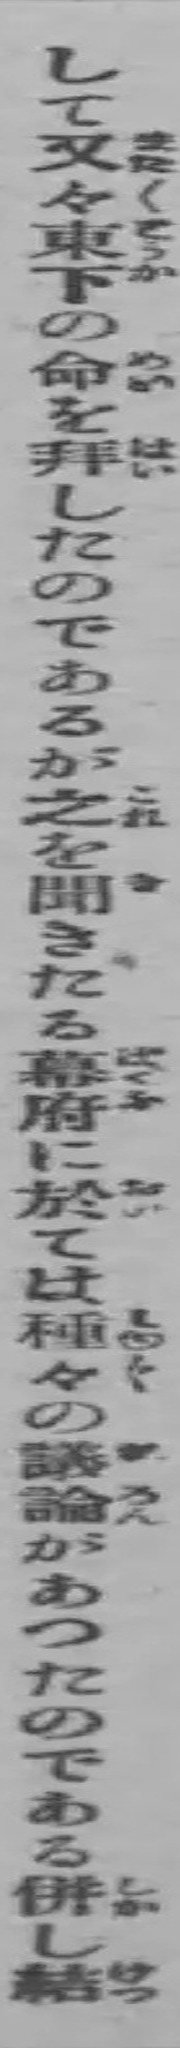して又々東下の命を拝したのであるが之を聞きたる幕府に於ては種々の議論があつたのである併し結
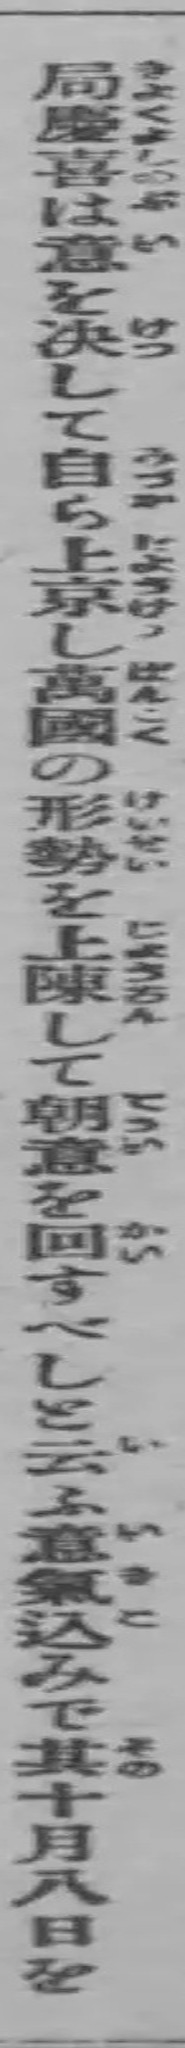局慶喜は意を決して自ら上京し万国の形勢を上陳して朝意を回すべしと云ふ意気込みで其十月八日を
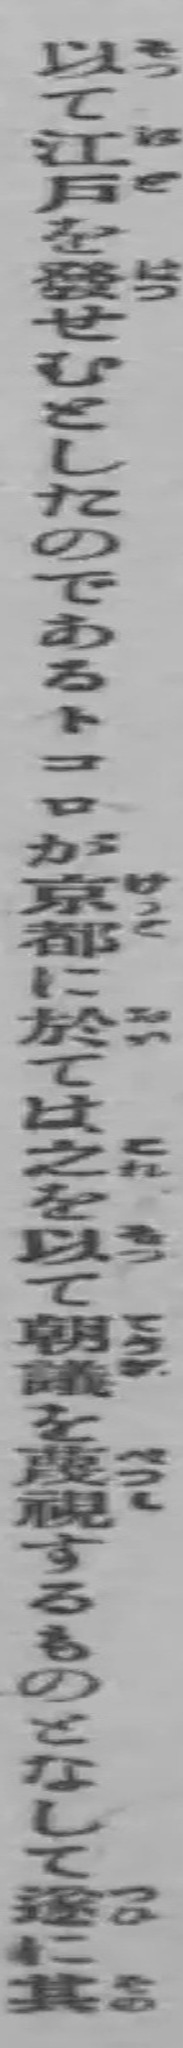以て江戸を発せむとしたのであるトコロが京都に於ては之を以て朝議を蔑視するものとなして遂に其
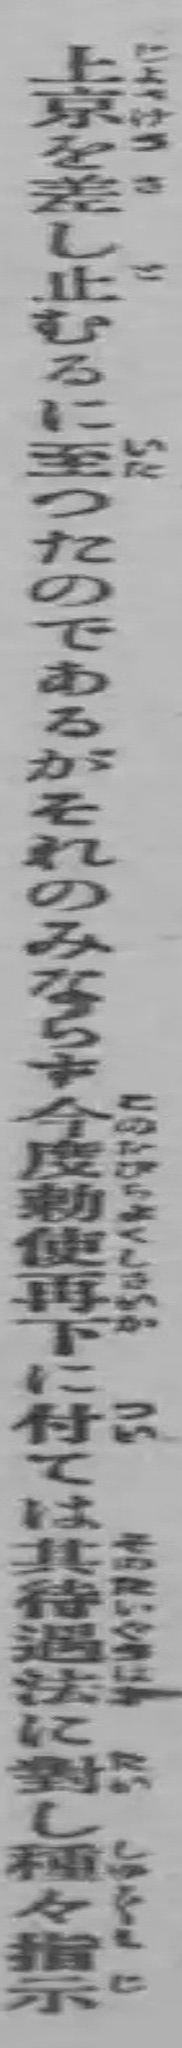上京を差し止むるに至つたのであるがそれのみならず今度勅使再下に付ては其待遇法に対し種々指示
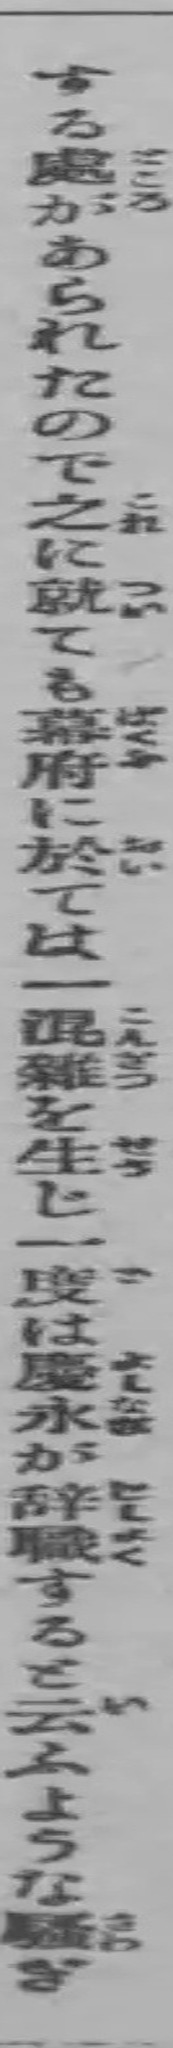する処があられたので之に就ても幕府に於ては一混雑を生じ一度は慶永が辞職すると云ふような騒ぎ
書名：豊橋市史談
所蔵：国立国会図書館 National Diet Library, JAPAN
